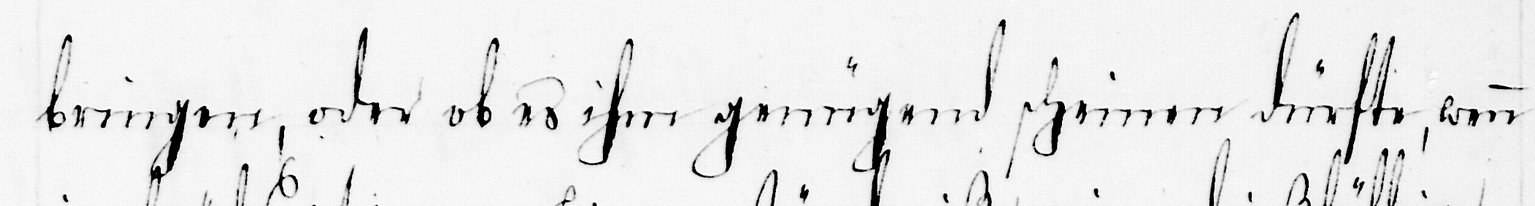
bringen, oder ob es ihm genügend scheinen dürfte, wenn
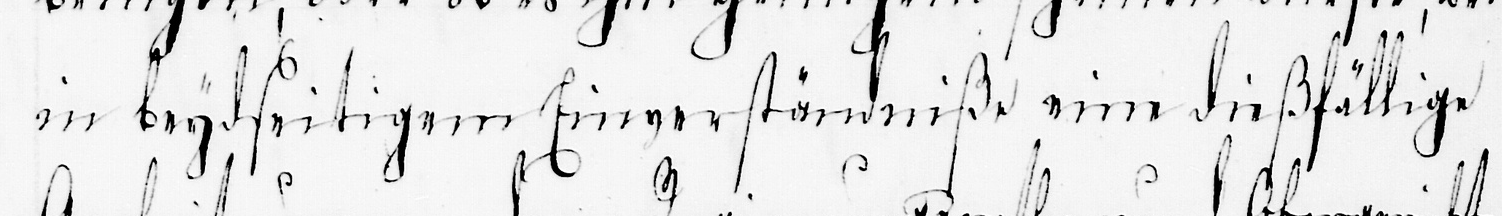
in beydseitigem Einverständniße eine dießfällige
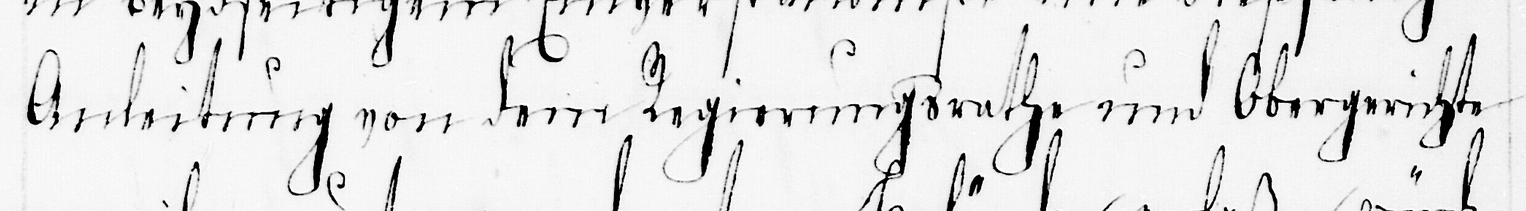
Anleitung von dem Regierungsrathe und Obergerichte
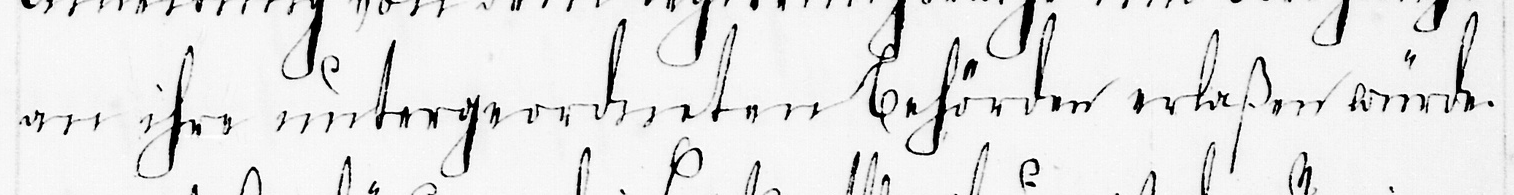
an ihre untergeordneten Behörden erlaßen würde.
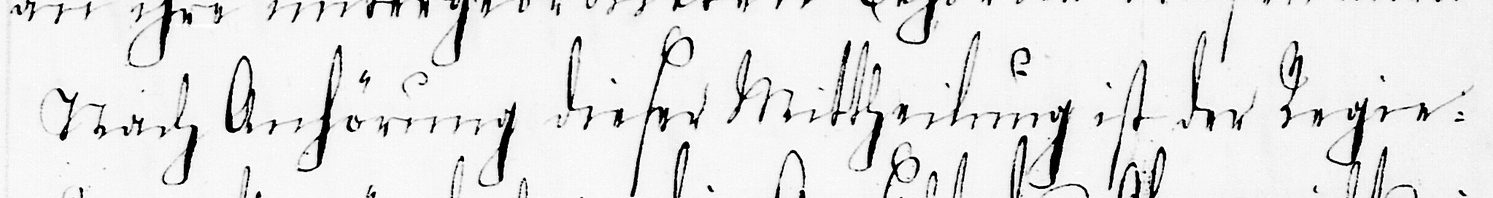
Nach Anhörung dieser Mittheilung ist der Regie¬
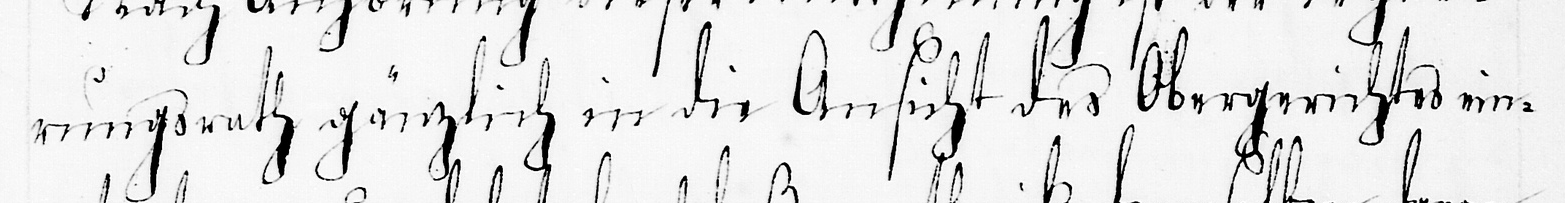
rungsrath gänzlich in die Ansicht des Obergerichtes ein¬
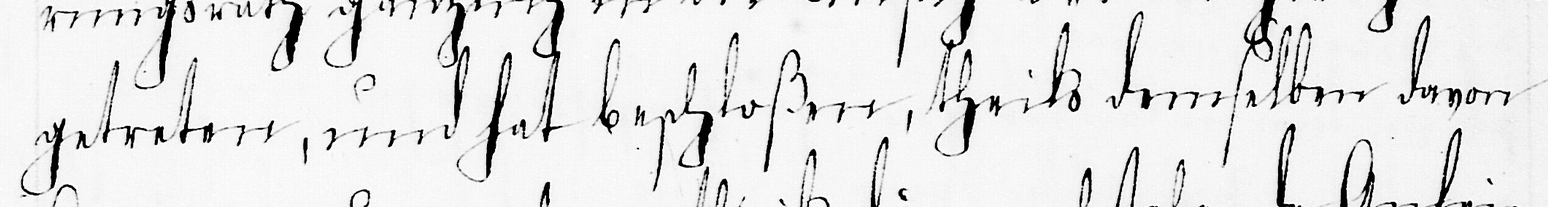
getreten, und hat beschloßen, theils demselben davon
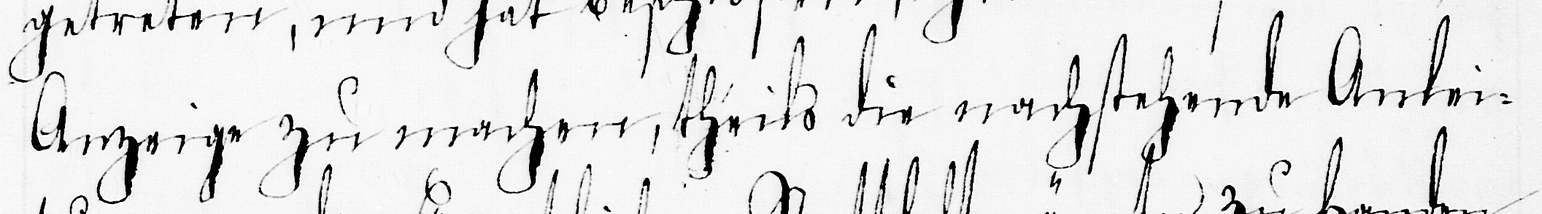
Anzeige zu machen, theils die nachstehende Anlei¬
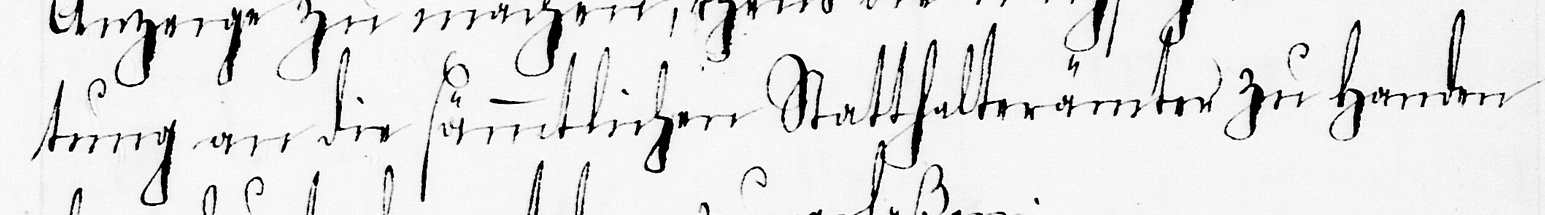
tung an die sämmtlichen Statthalterämter zu Handen
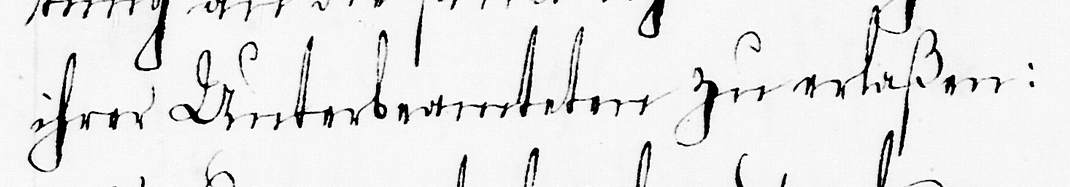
ihrer Unterbeamteten zu erlaßen:
